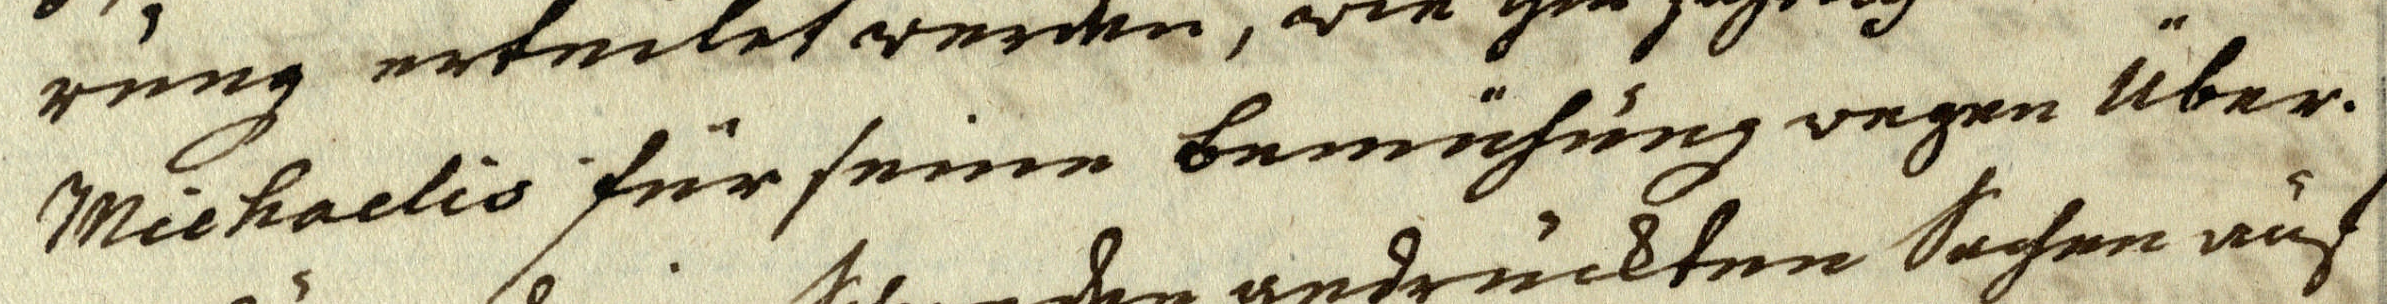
Michaelis für seine Bemühung wegen Über¬
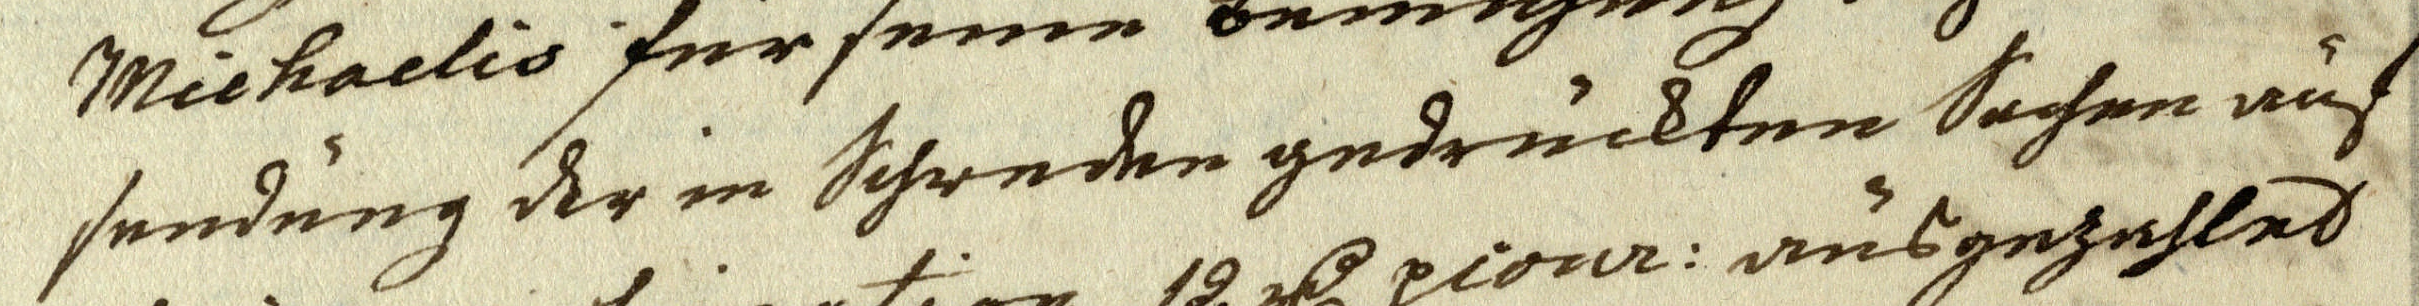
sendung der in Schweden gedruckten Sachen auf
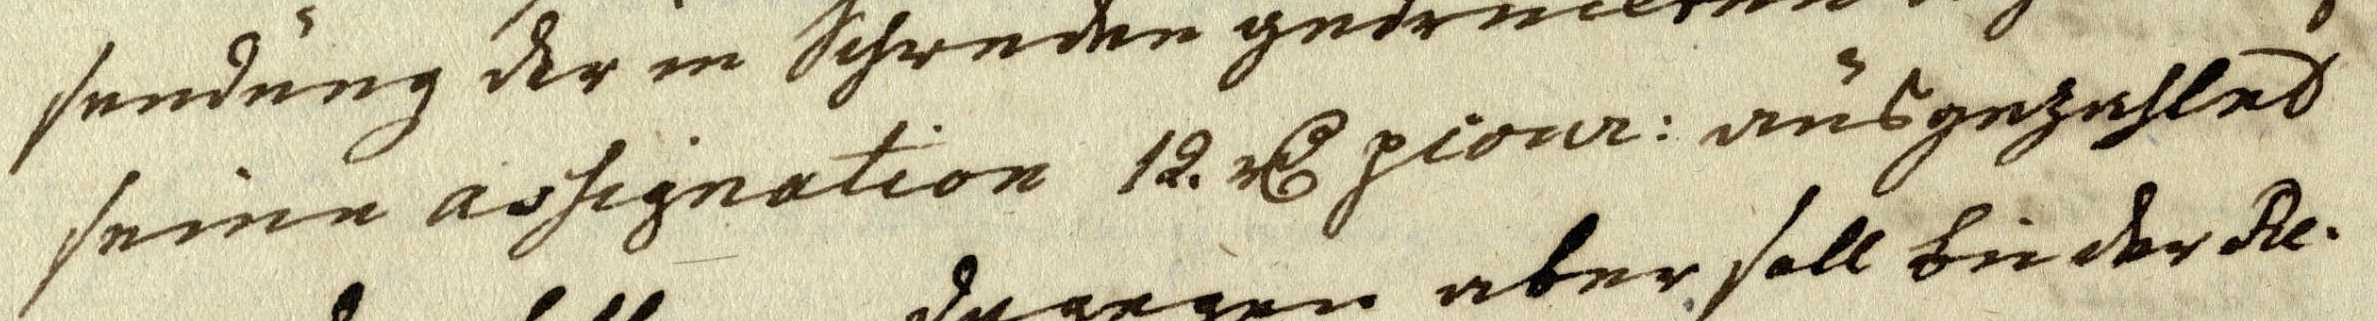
seine assignation 12. rl. pcour. ausgezahlet
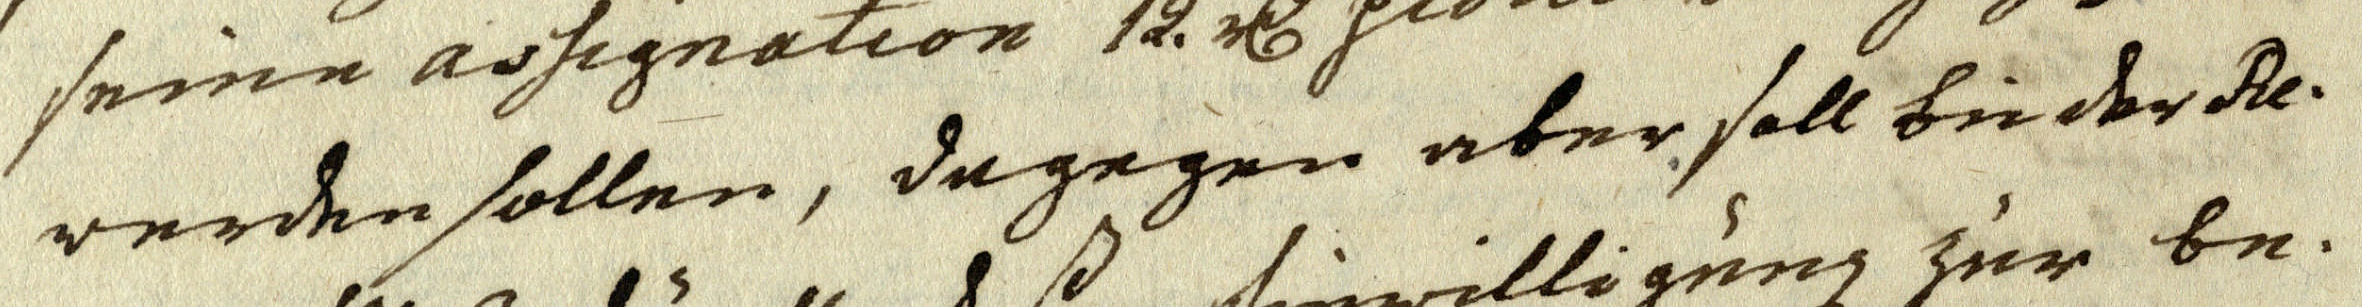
werden sollen, dagegen aber soll bei der Re¬
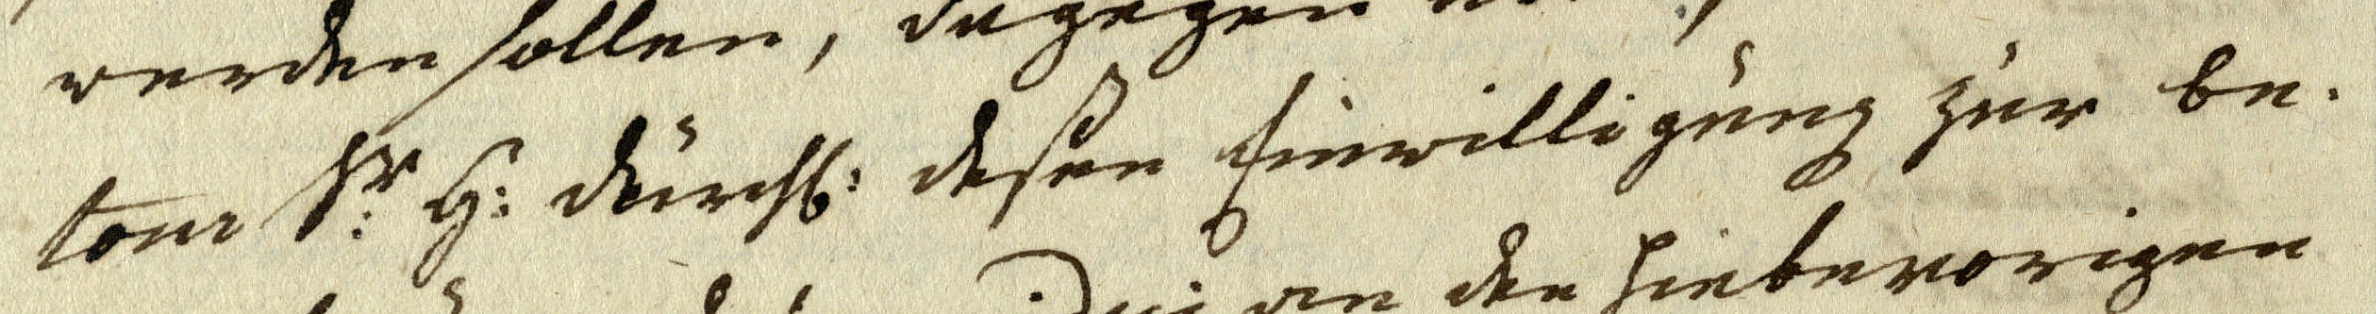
tour Sr H. Durchl. deßen Einwilligung zur be¬
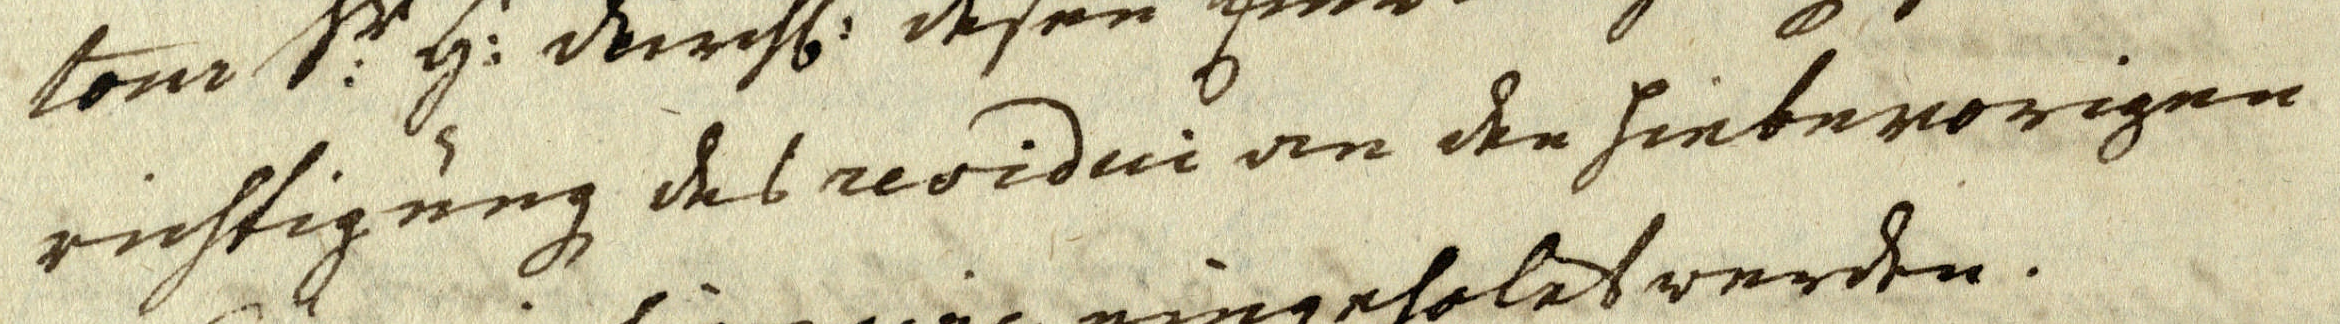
richtigung des residui an den hiebevorigen
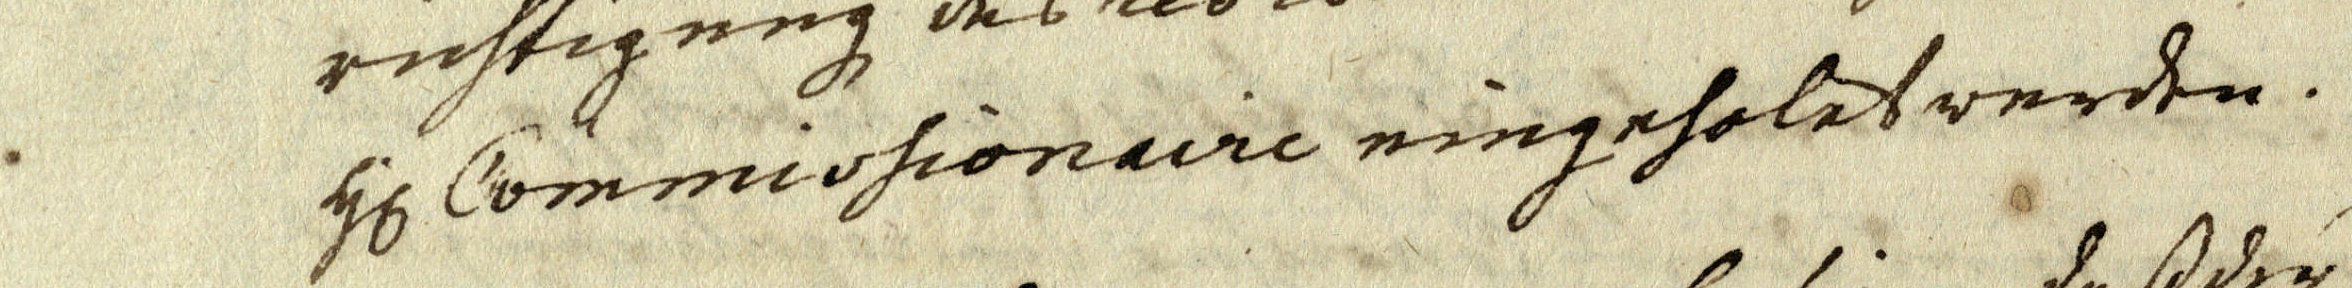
H. Commissionaire eingeholet werden.
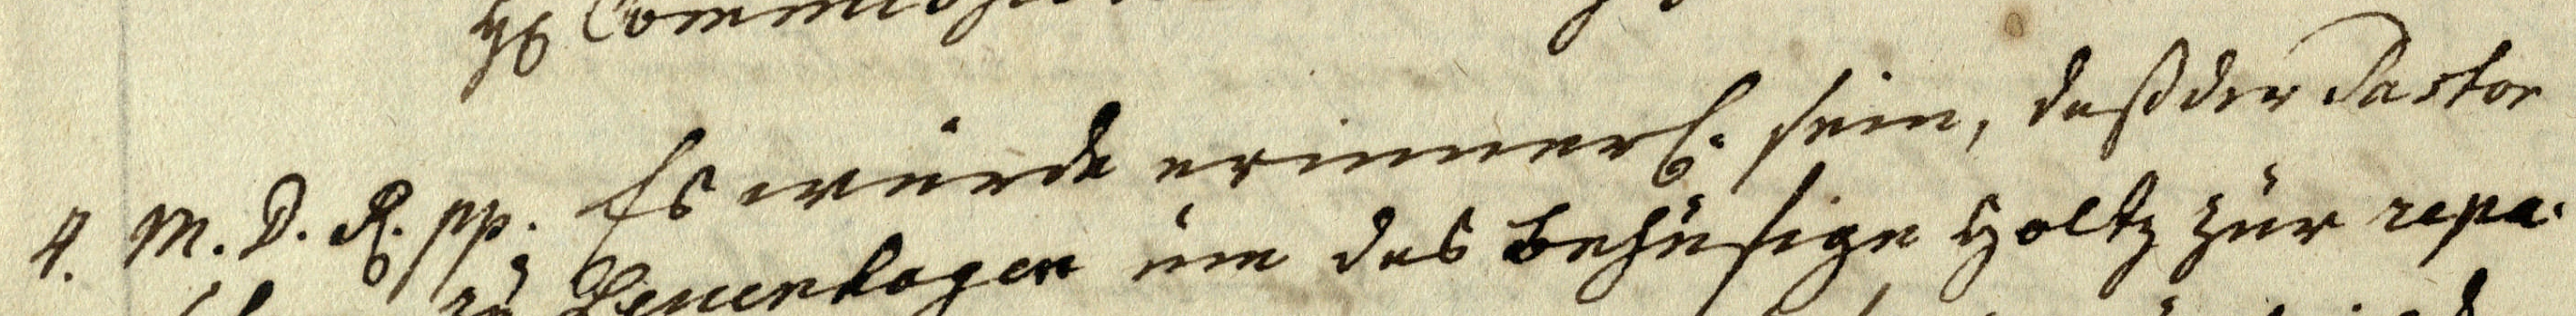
4. M. D. R. pp. Es würde erinnerl. sein, daß der Pastor
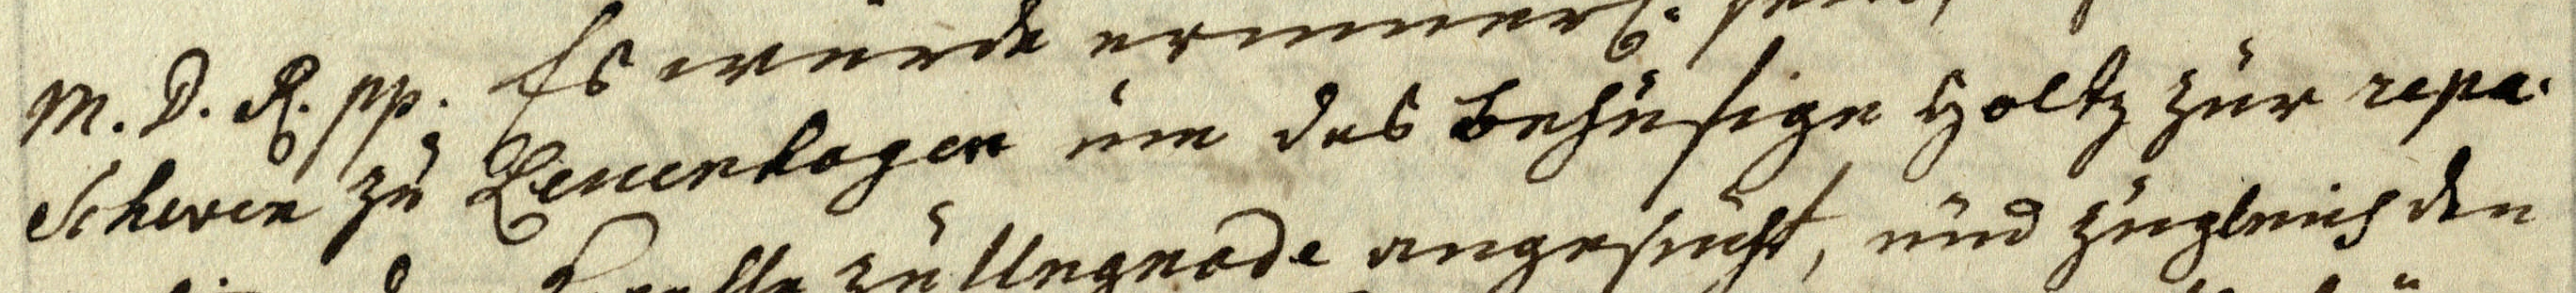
Scheven zu Levenhagen um das behufige Holtz zur repa¬
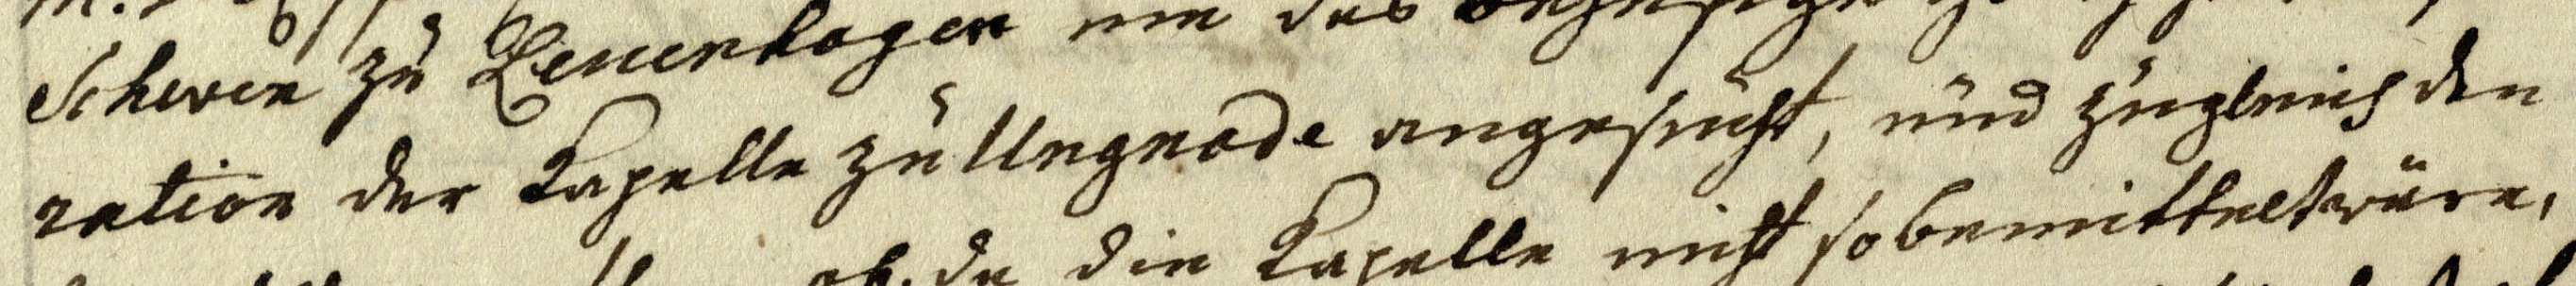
ration der Kapelle zu Ungnade angesucht, und zugleich den
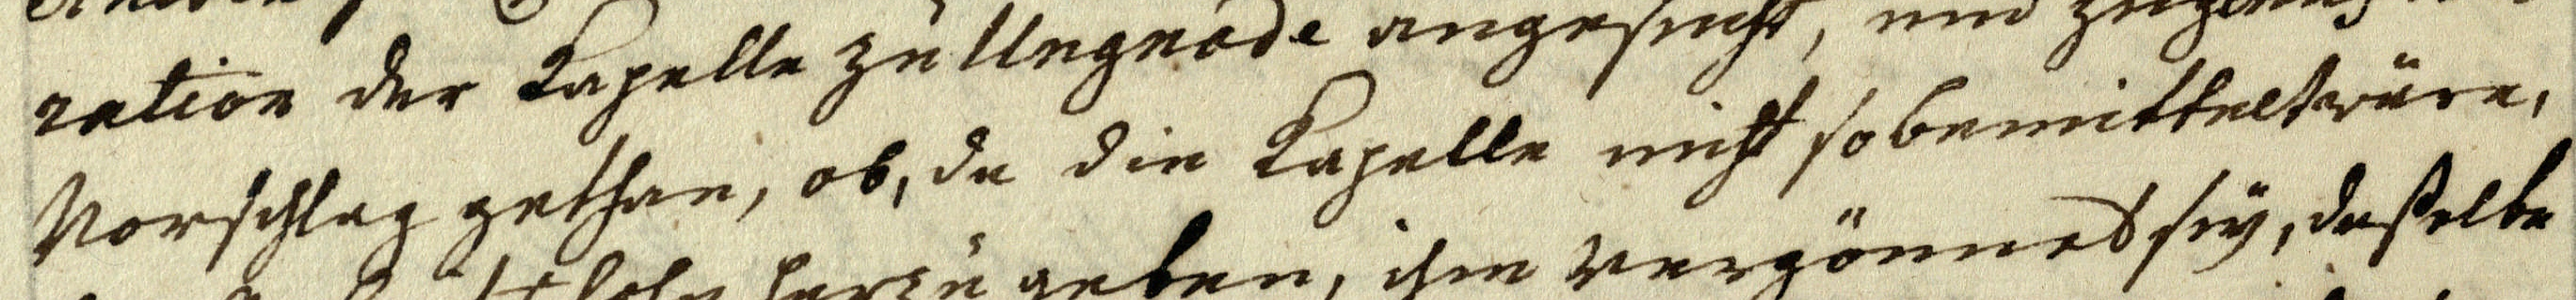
Vorschlag gethan, ob, da die Kapelle nicht so bemittelt wäre,
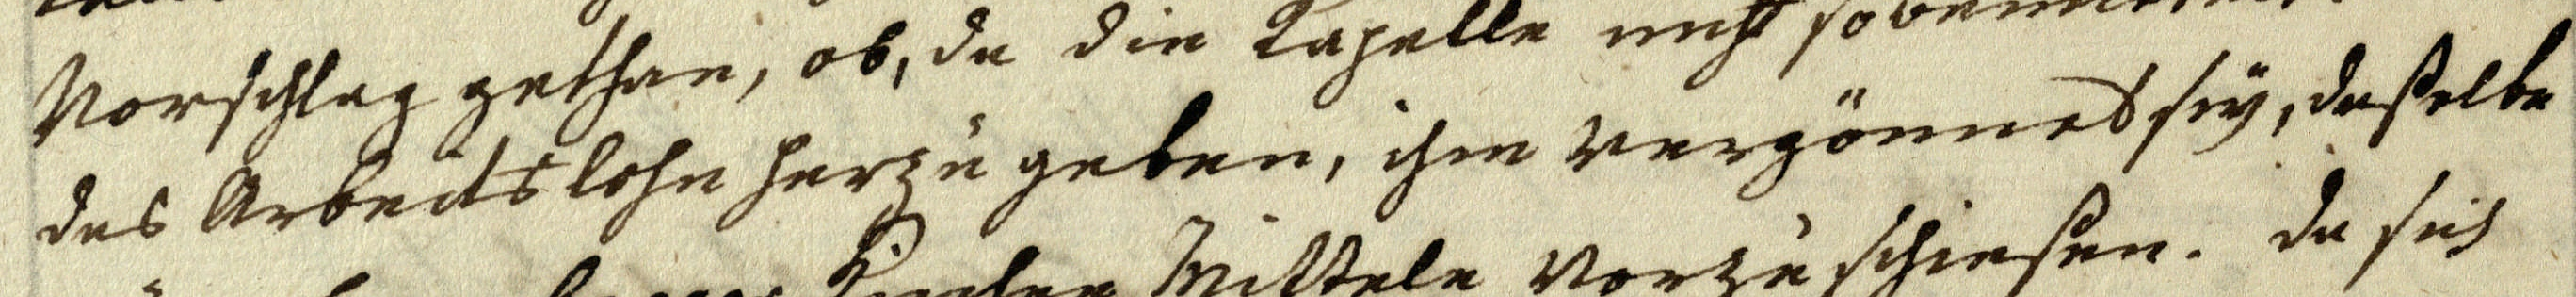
das Arbeitslohn herzugeben, ihm vergönnet seÿ, daßelbe
